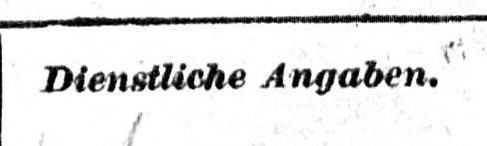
Dienstliche Angaben.
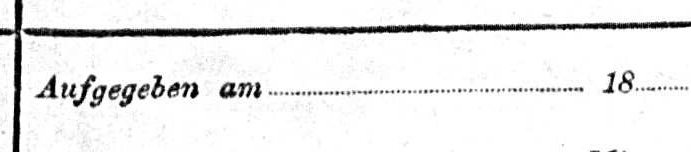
Aufgegeben am................................18....
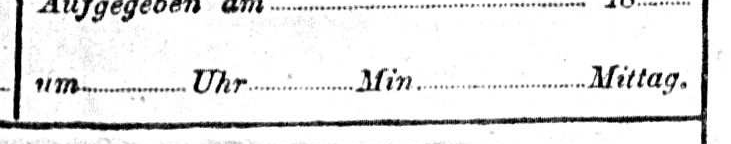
um ...............Uhr..........Min..............Mittag.
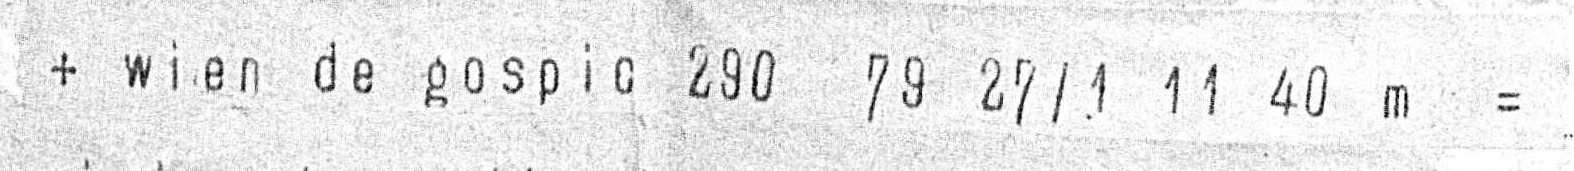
+ wien de gospic 290 79 27/1 11 40 m =
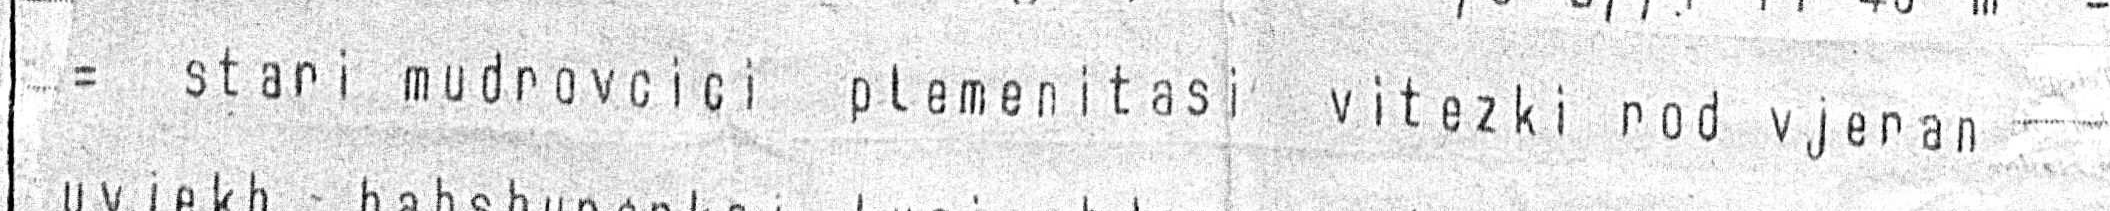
= stari mudrovcici plemenitasi vitezki rod vjeran
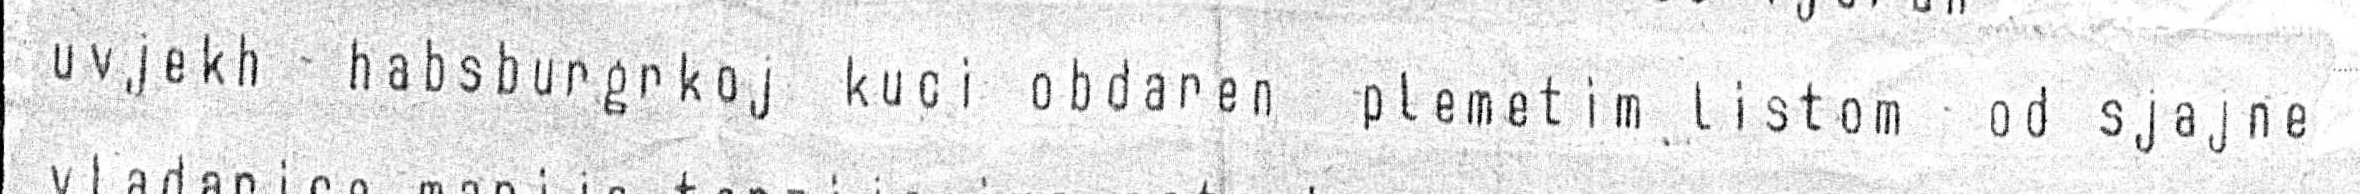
uvjekt habsburgrkoj kuci obdaren plemetim Listom od sjajne
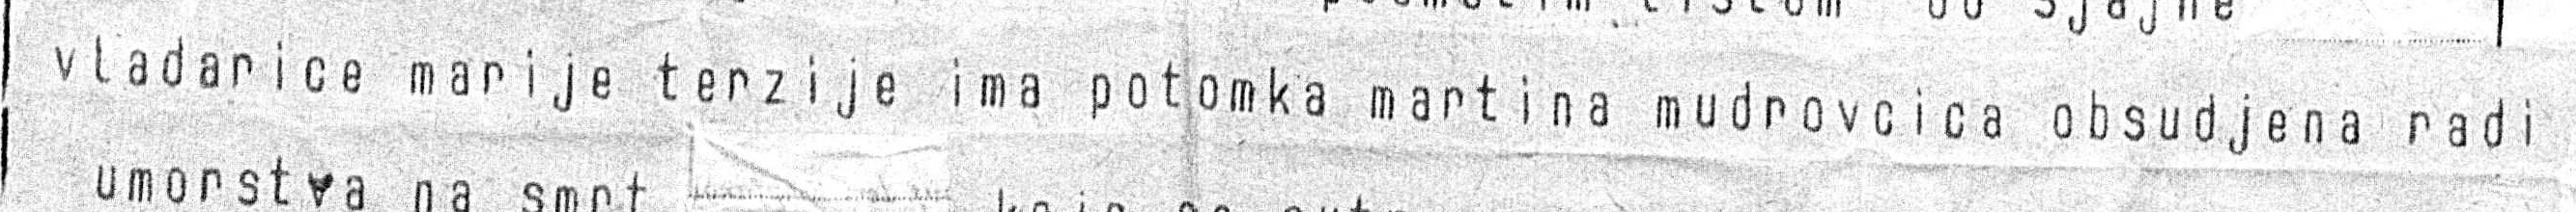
vladarice marije terzije ima potomka martina mudrovcica obsudjena radi
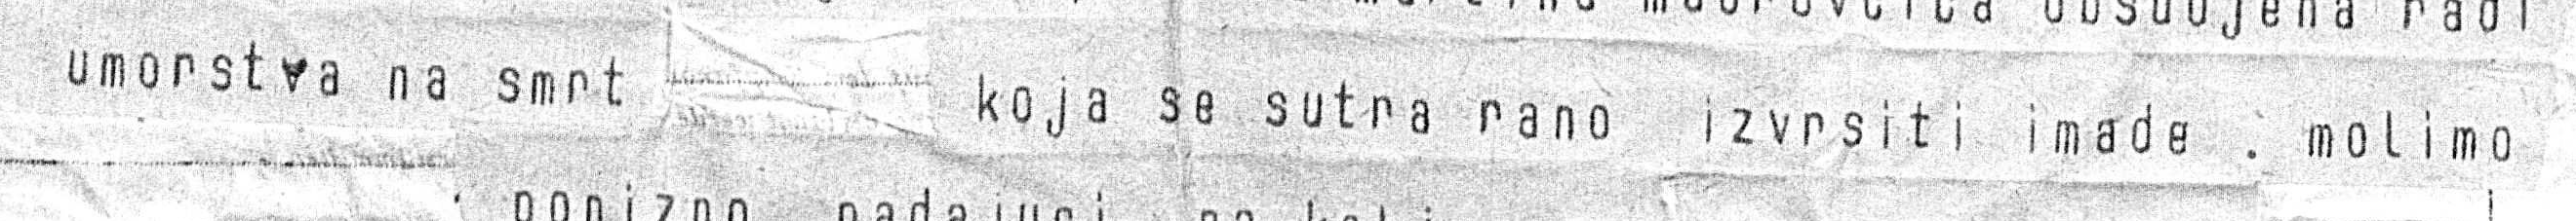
umorstva na smrt koja se sutra rano izvrsiti imade. molimo
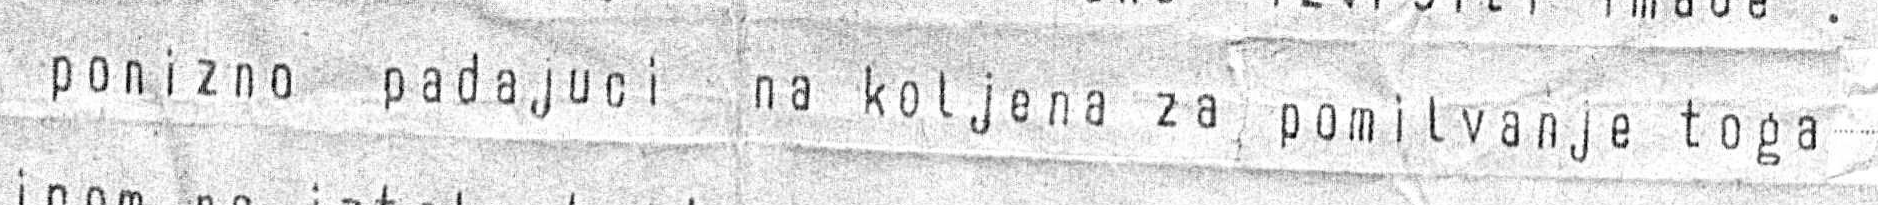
ponizno padajuci na koljena za pomilvanje toga
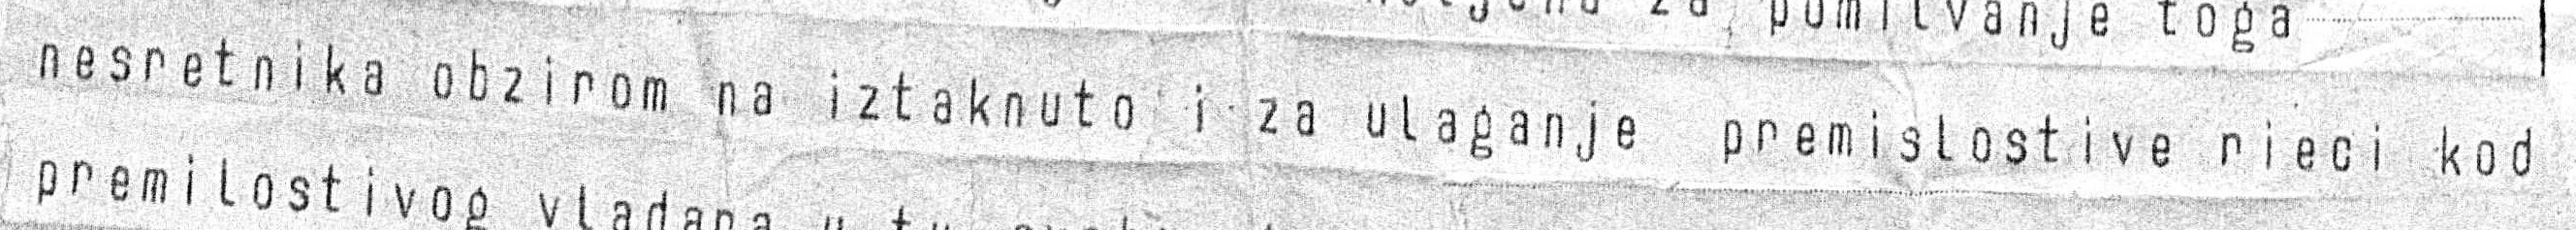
nesretnika obzirom na iztaknuto i za ulaganje premislostive rieci kod
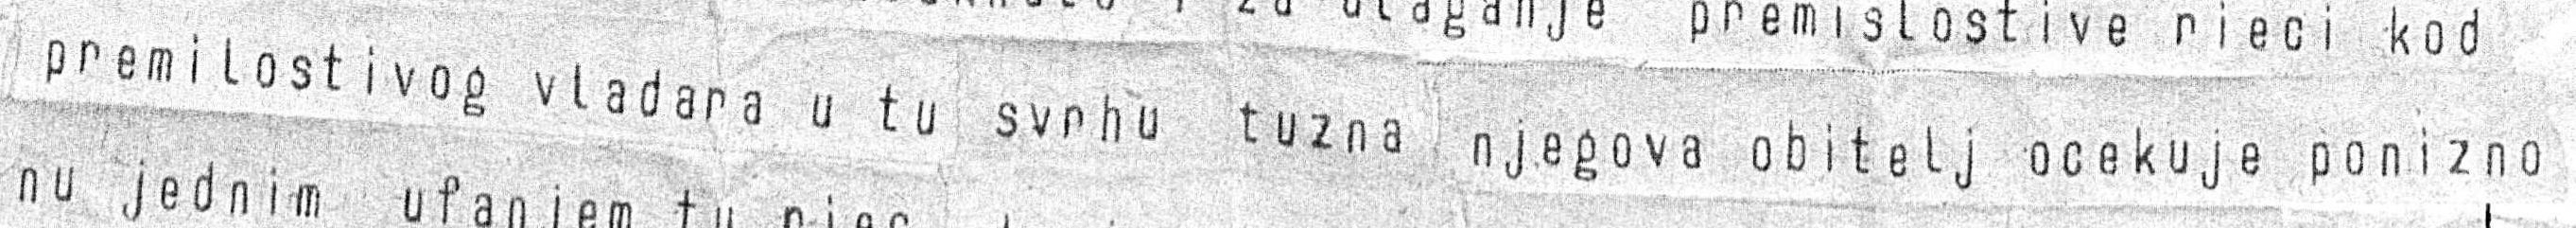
premilostivog vladara u tu svrhu tuzna njegova obitelj ocekuje ponizno
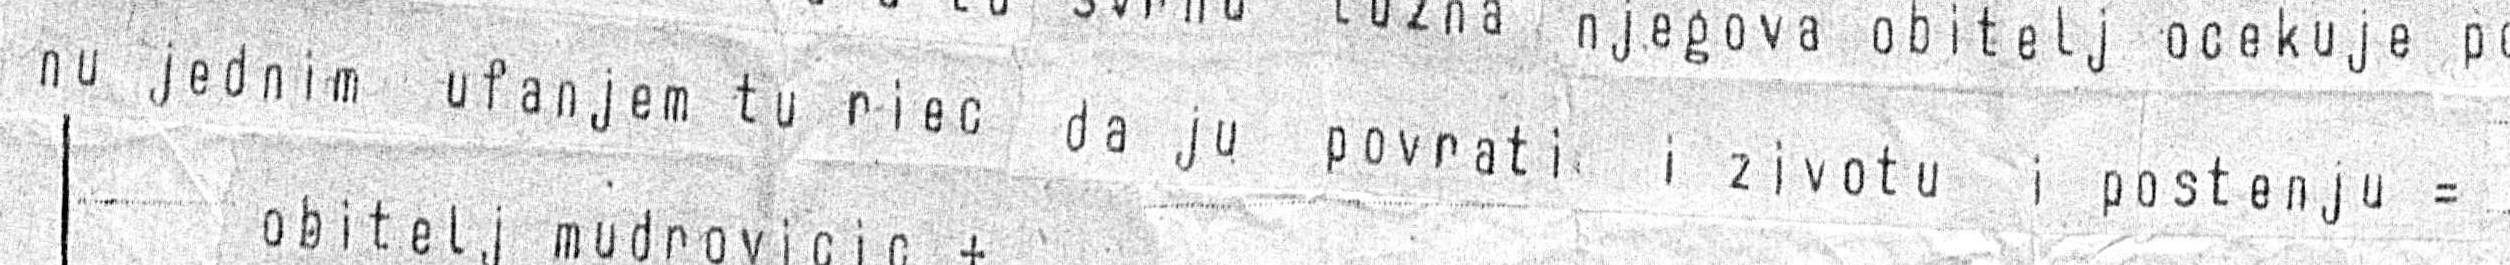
nu jednim ufanjem tu riec da ju povrati I zivotu I postenju =
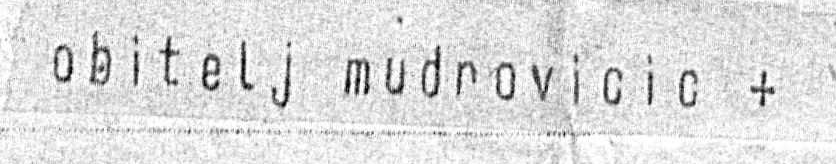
obitelj mudrovicic +
